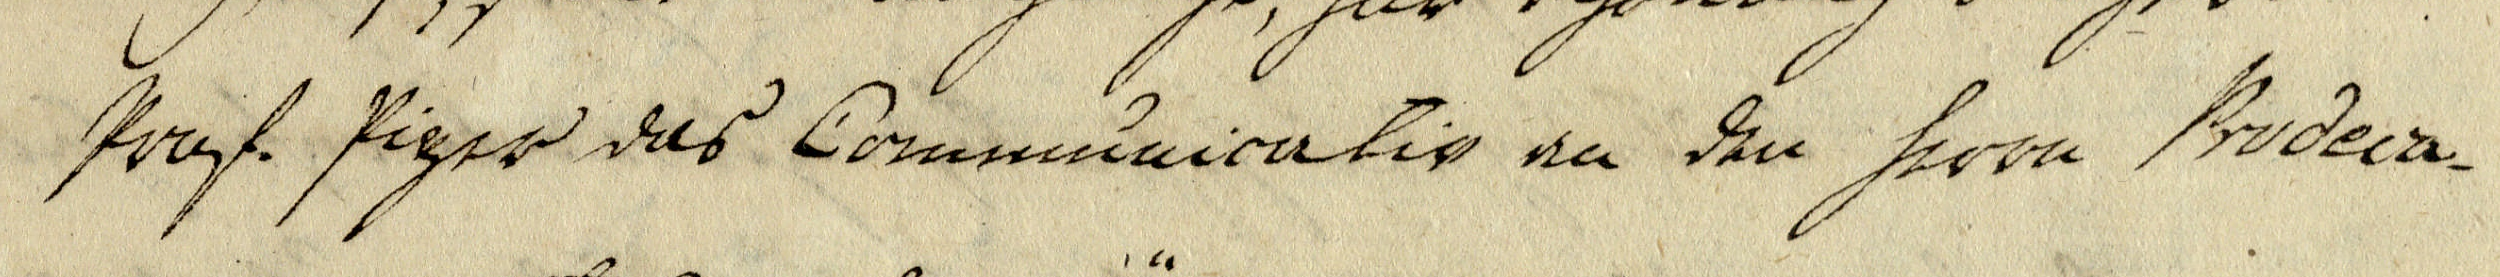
Prof. Piper das Communicativ an den Herrn Prodeca¬
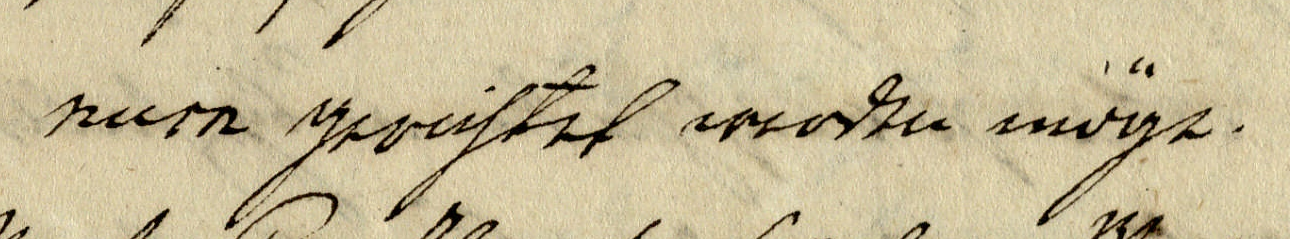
num gerichtet werden möge.
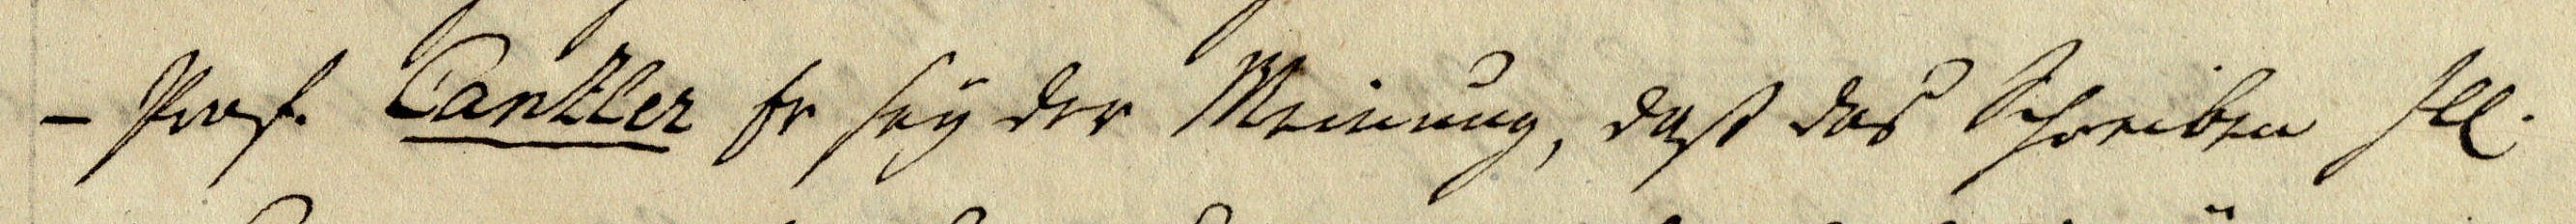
Prof. Canzler Er seÿ der Meinung, daß das Schreiben Ill.
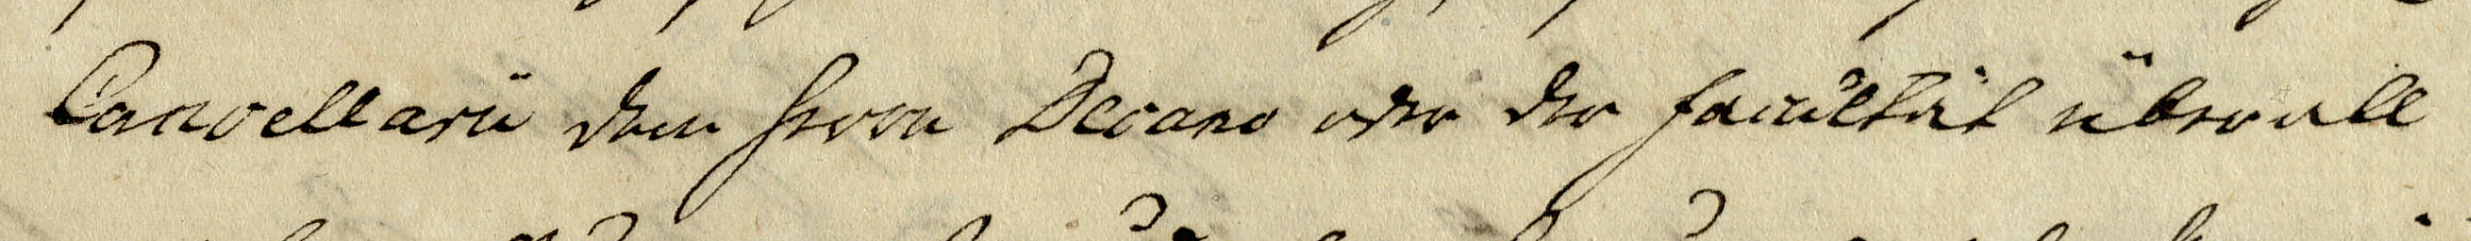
Cancellarii dem Herrn Decano oder der Facultät überall
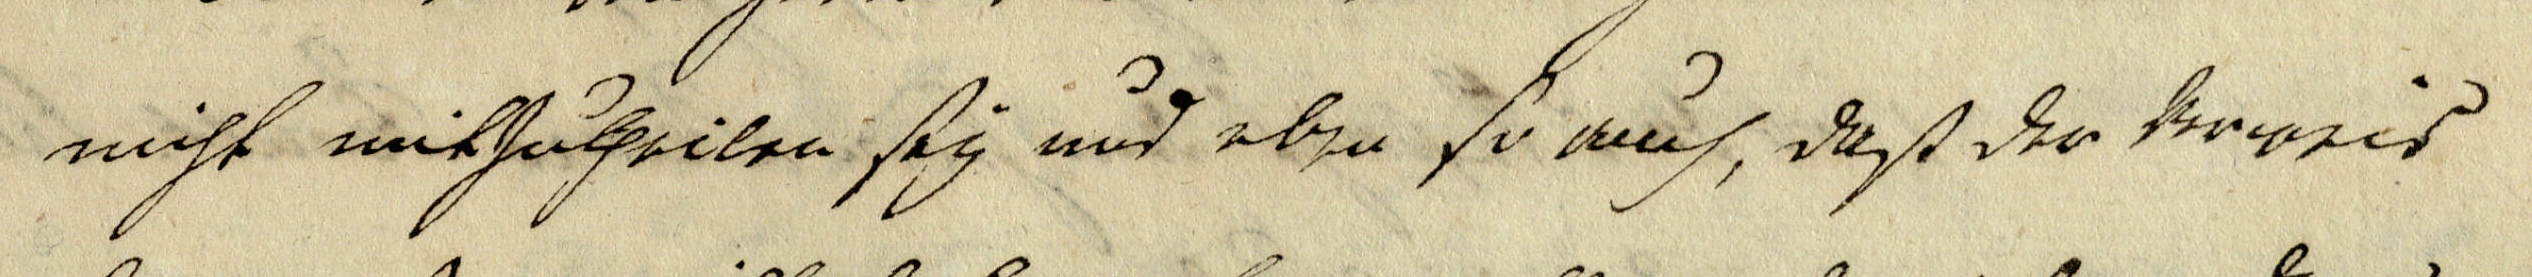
nicht mitzutheilen seÿ und eben so auch, daß der Verweis
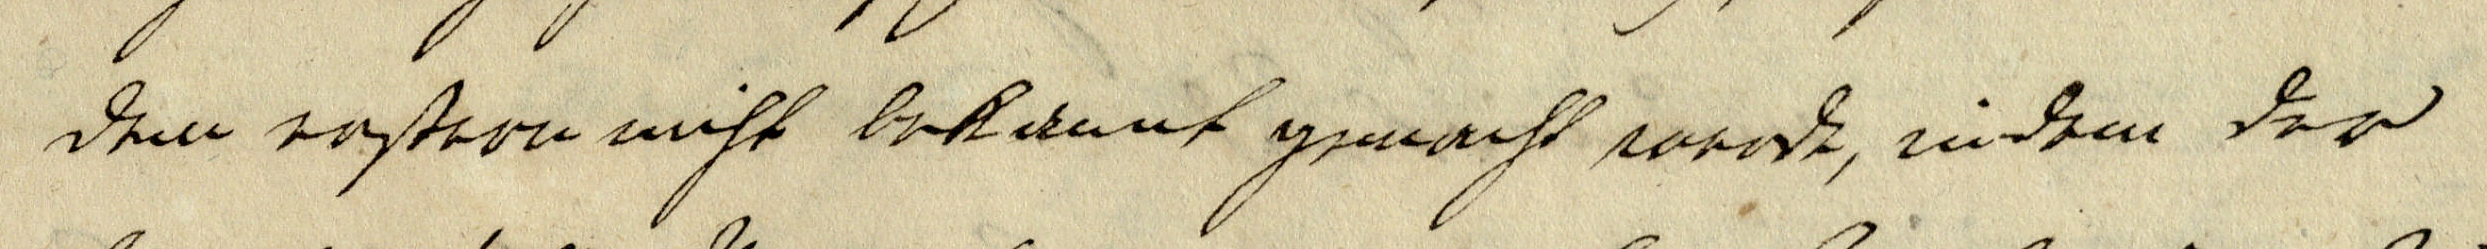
dem erstern nicht bekannt gemacht werde, indem der
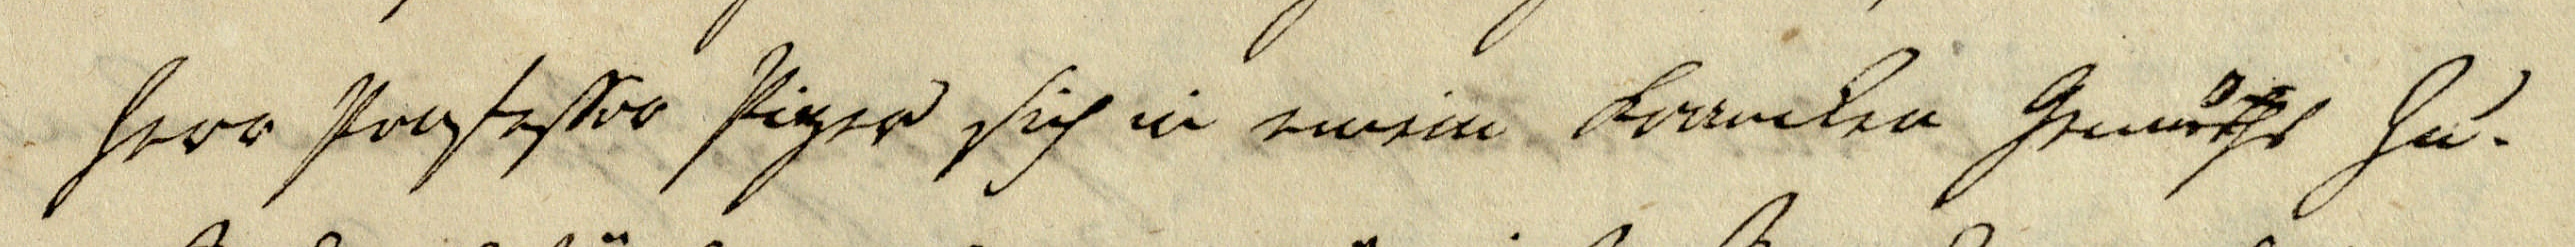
Herr Professor Piper sich in einem krancken Gemüths Zu¬
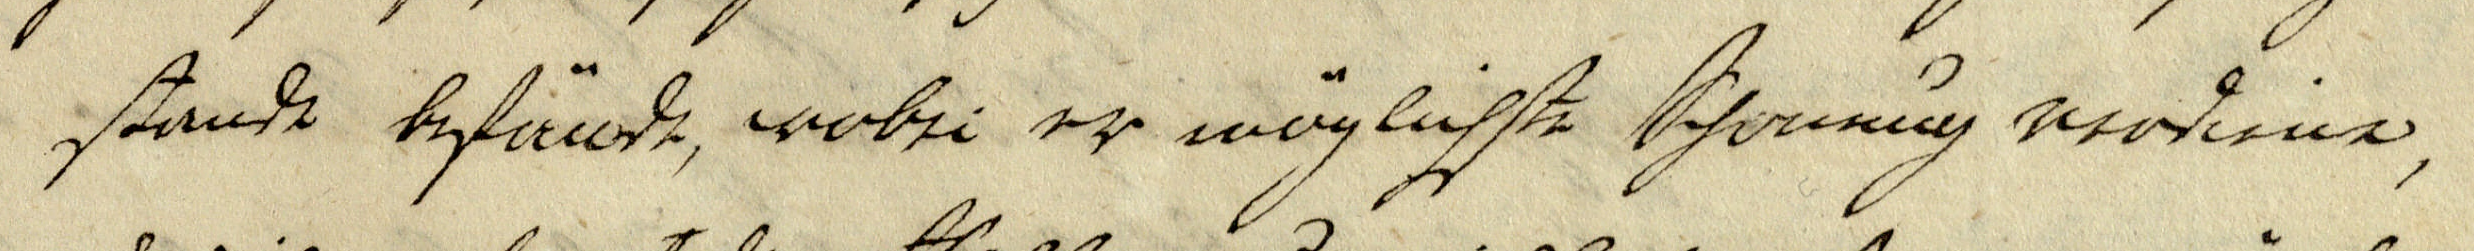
stande befände, wobei er möglichste Schonung verdiene,
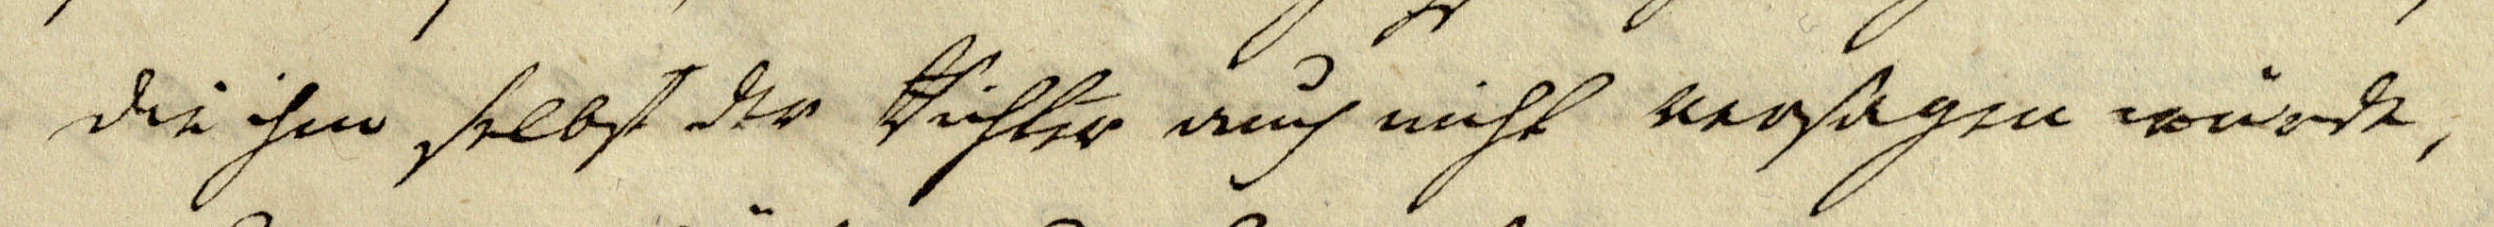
die ihm selbst der Richter auch nicht versagen würde,
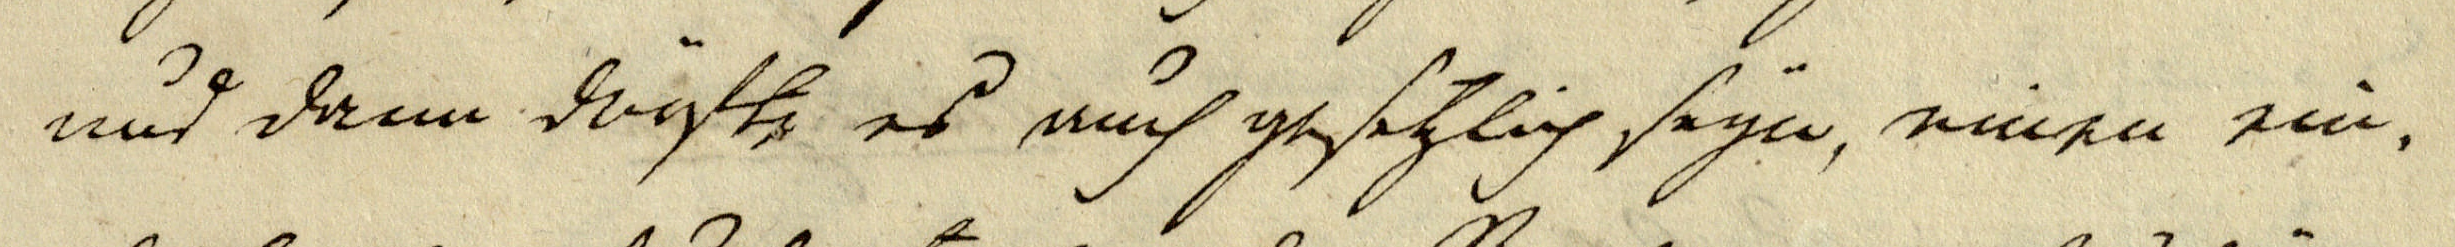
und dann dürfte es auch gesetzlich seÿn, einen ein¬
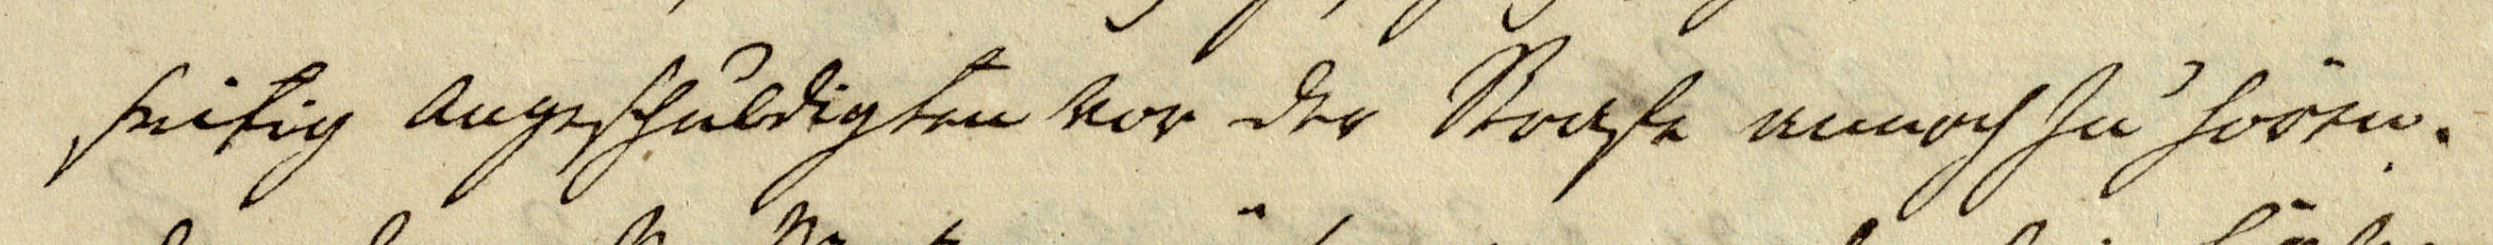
seitig Angeschuldigten vor der Strafe annoch zu hören.
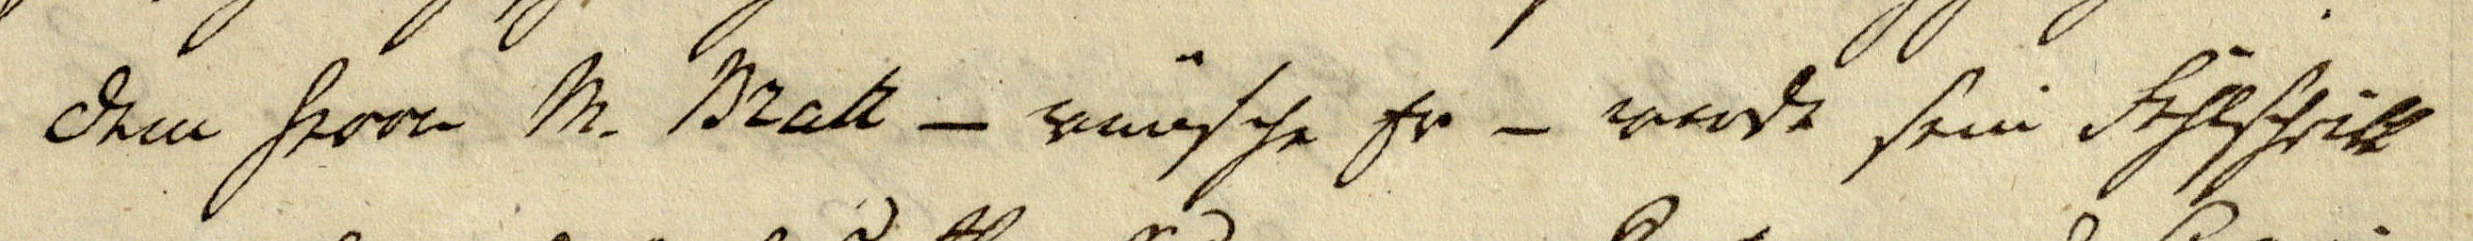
Dem Herrn M. Bratt - wünsche Er - werde sein Fehltritt
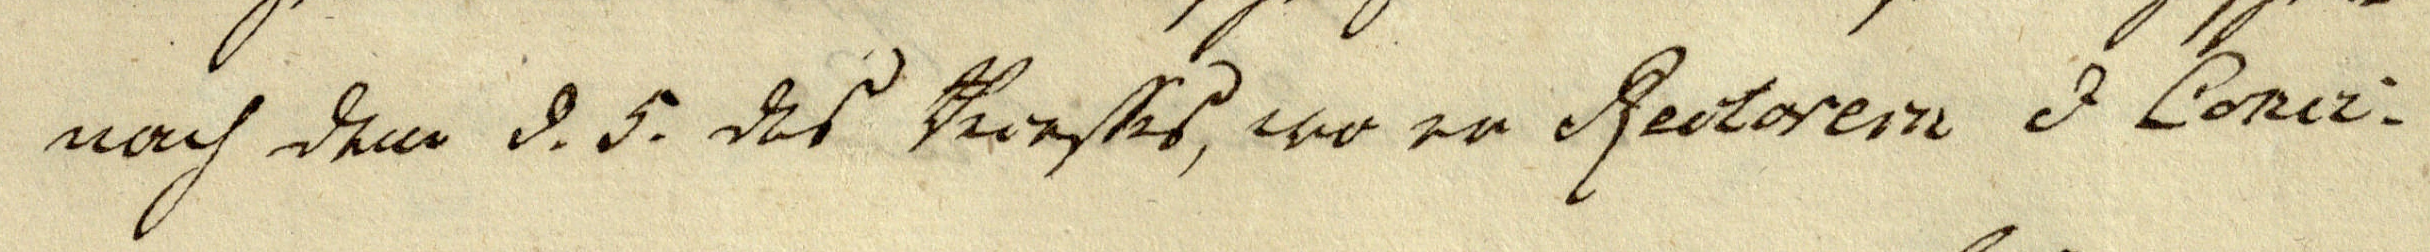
nach dem §. 5. des Recesses, wo er Rectorem et Conci¬
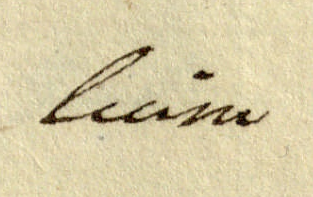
lium
